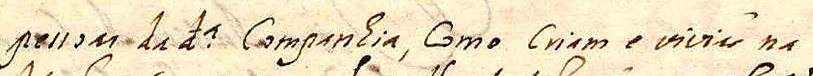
pessoas da d̄.a Companhia, como criam o viviaõ na
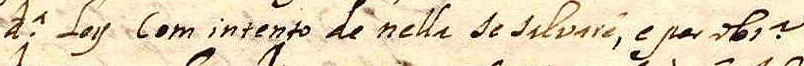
d̄.a Ley com intento de nella se salvarē, e por obs.ça
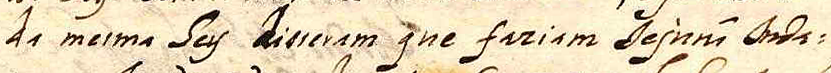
da mesma Ley disseram que faziam Iejuns̄ Iuda
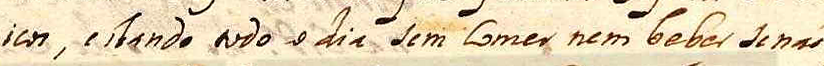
icos, estando todo o dia sem comer nem beber senaõ
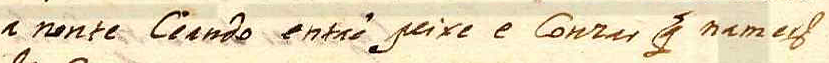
a noute Ceando entaõ peixe e couzas q̄ nam erā
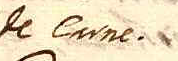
de carne.
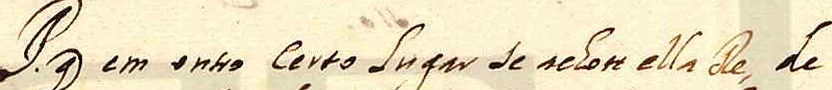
P. q̄ em outro Certo lugar se achou ella Re, de
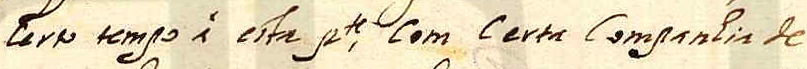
certo tempo á esta pte, com certa Companhia de
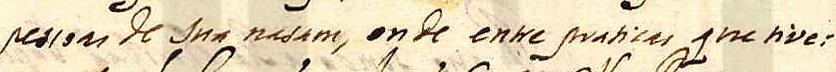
pessoas de sua nasam, onde entre praticas que tive
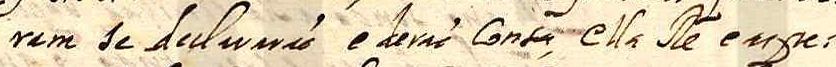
ram se declararaõ e deraõ conta, ella Re e as pe
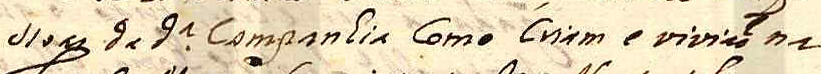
ssoas da d.a Companhia Como Criam e viviaõ na
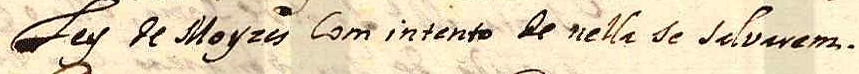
Ley de Moyzes com intento de nella se salvarem.
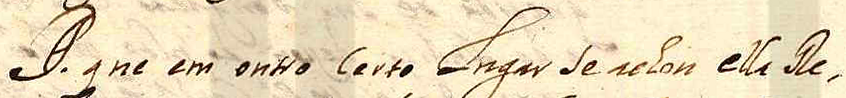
P. que em outro certo Lugar se achou ella Re,
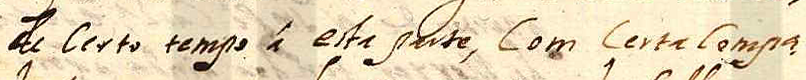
de certo tempo á esta parte, Com Certa Compa.
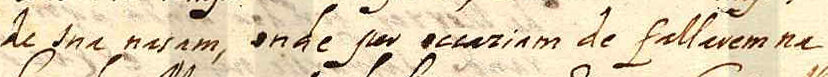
de sua nasam, onde por occaziam de fallarem na
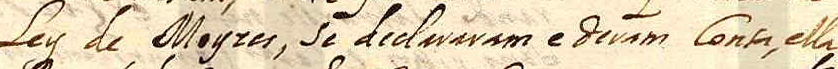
Ley de Moyzes, se declararam e deram Conta, ella
